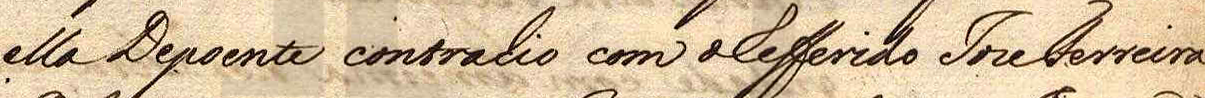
ella Depoente contrahio com o Refferido Ioze Ferreira
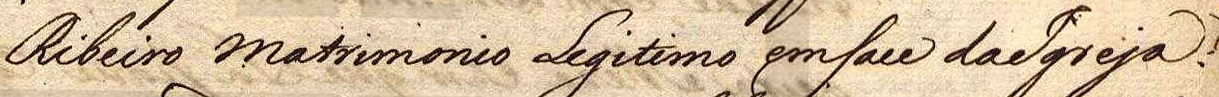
Ribeiro matrimonio Legitimo em face da Igreja?
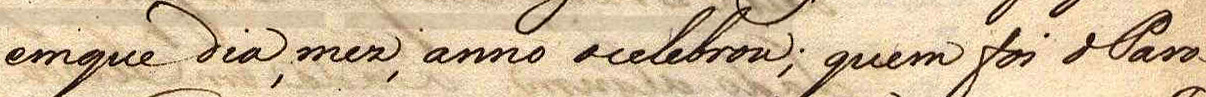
em que dia, mez, anno o celebrou; quem foi o Paro
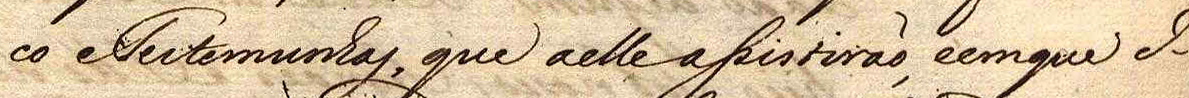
co e Testemunhas, que a elle assistiraõ, e em que I
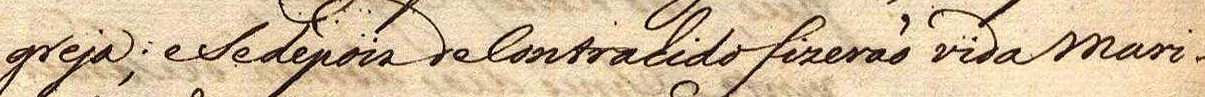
greja; e Se depoiz de contrahido fizeraõ vida mari
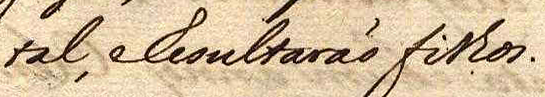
al, e Rezultaraõ filhos.
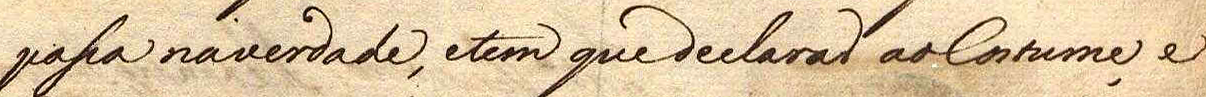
passa na verdade, e tem que declarar ao Costume, e
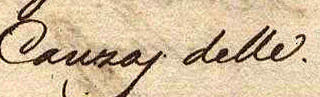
Couzas delle.
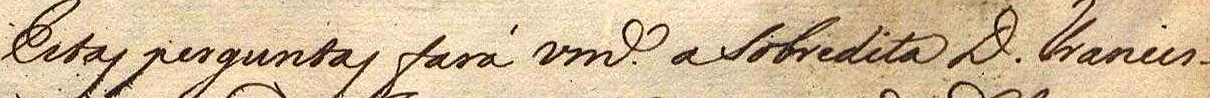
Estas perguntas fará vm.e a Sobredita D. Francis
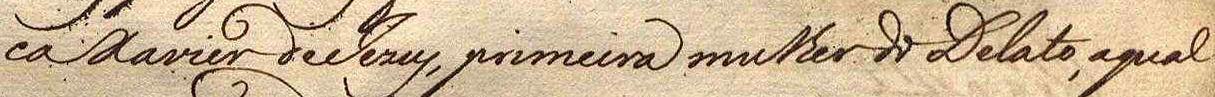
ca Xavier de Iezus, primeira mulher do Delato, a qual
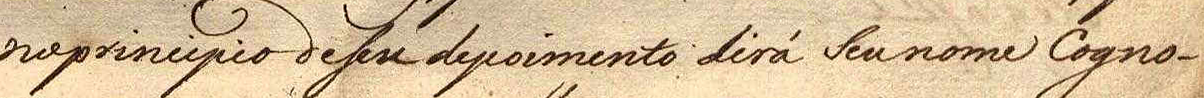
no principio de seu depoimento dirá seu nome cogno
